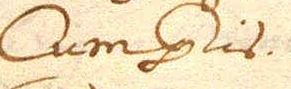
Cumprir.
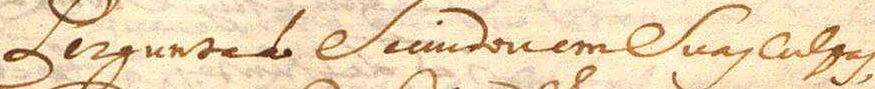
Perguntado Se cuidou em Suas Culpas,
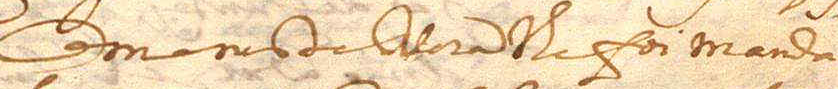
Como nesta Meza lhe foi manda
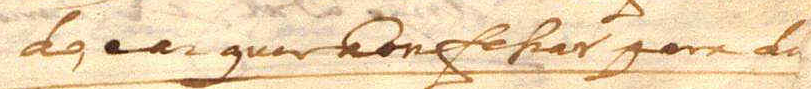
do, e as quer Confessar para de
